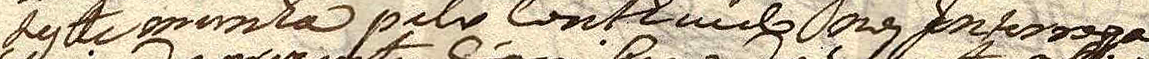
testemunha pelo Contheudo nos Jnterroga
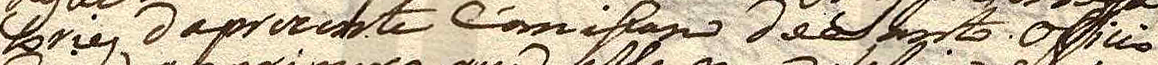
torios da prezente Cōmissam do Santo officio
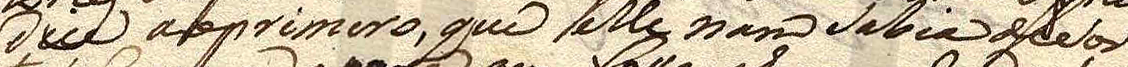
dice ao primero, que selhe, nam sabia de sor
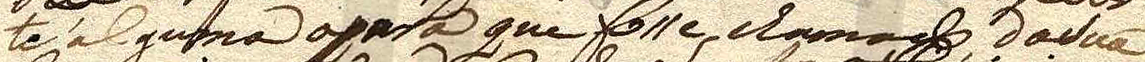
te alguma o para que fosse, chamado da sua
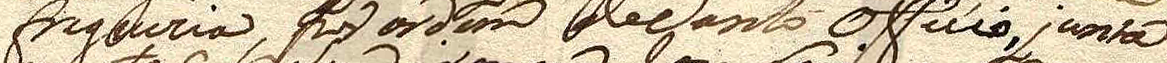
freguezia, por ordem do Santo officio, junta
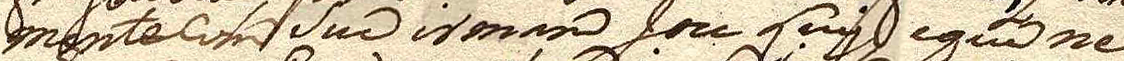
mente com seu irmam Joze Luis e que ne
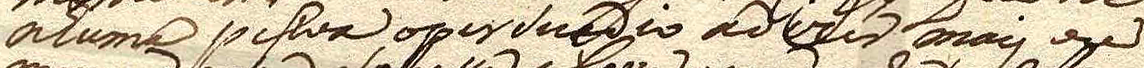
nhuma pessoa o persuadio a dizer mais ou
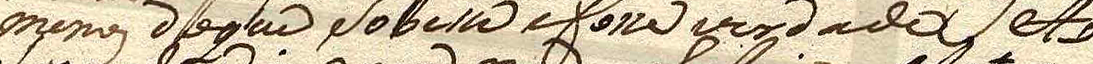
menos do que sobesse e fosse verdade Ao
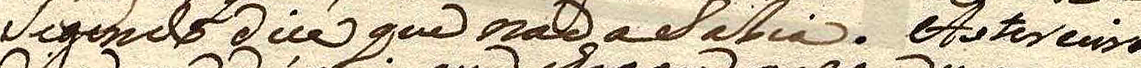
segundo diçe que nada Sabia. Ao terceiro
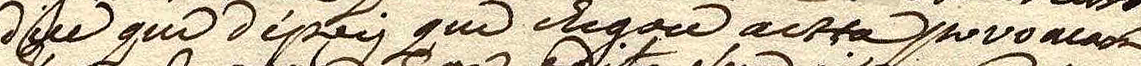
dice que depois que chegou a esta povoacam
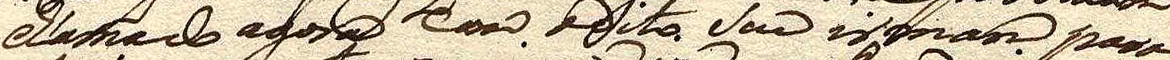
chamado agora com o dito seu irman para
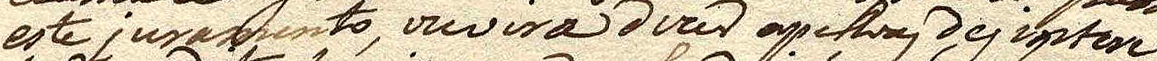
este juramento, ouvira dizer a pessoas desintere
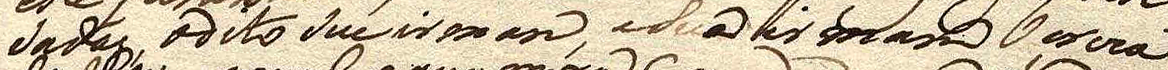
sadas o dito seu irman, e Sua irmam Tereza
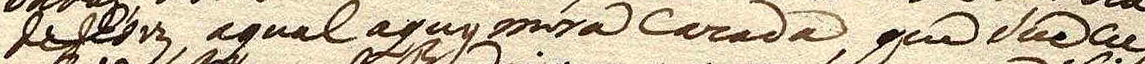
de Iesuz, a qual aquy mora cazada, que seu cu
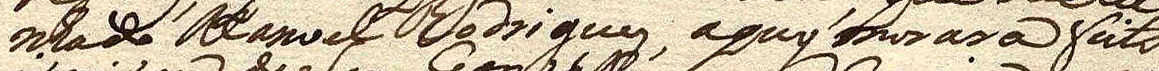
nhado Manoel Rodriquez, aquy morara feito
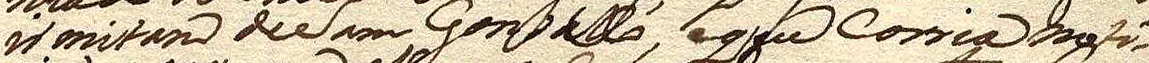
irmitam de Sam Gonsallo, e que corria noti
